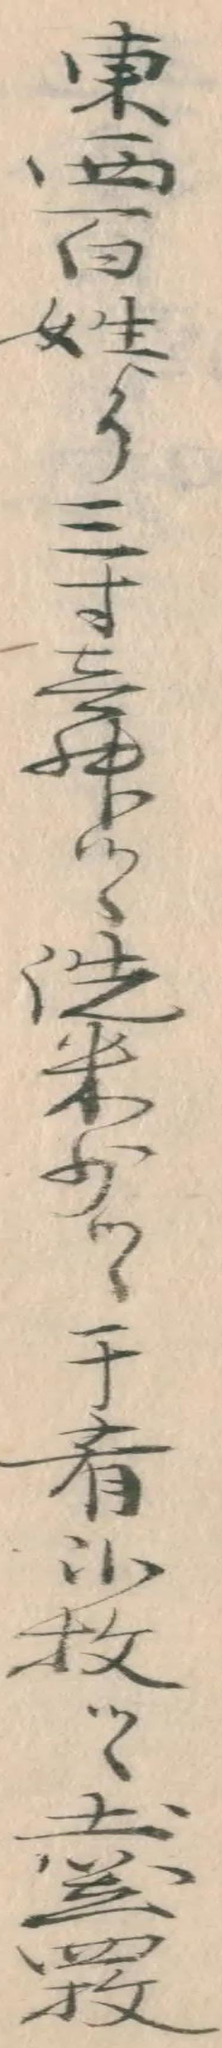東西百姓より三寸壱升ツヽ洗米少ツヽ干肴弐枚ツヽ土器四枚
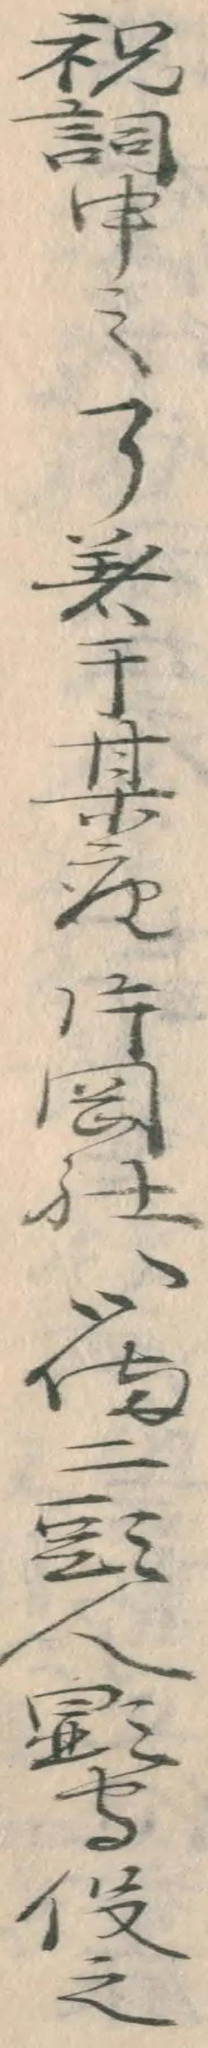祝詞申之了着于某座片岡社へ御備二頭人顕守役之
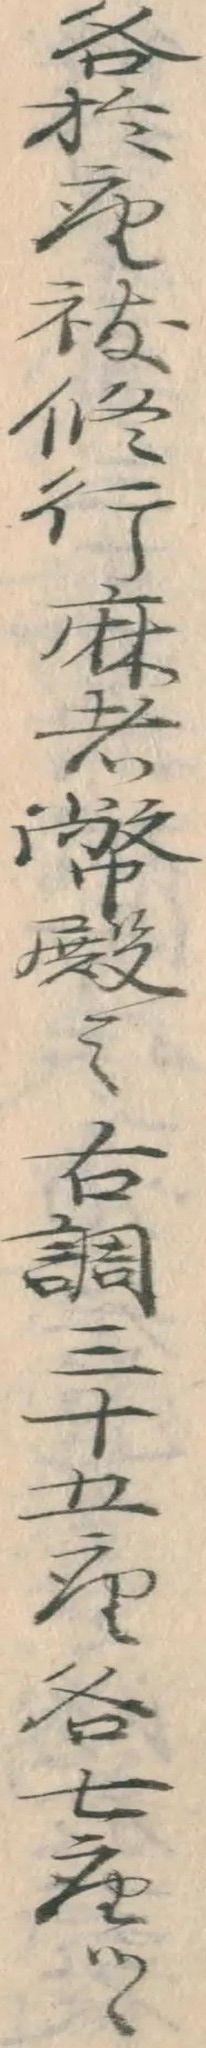各於座祓修行麻者幣殿也古調三十五座各七座ツヽ

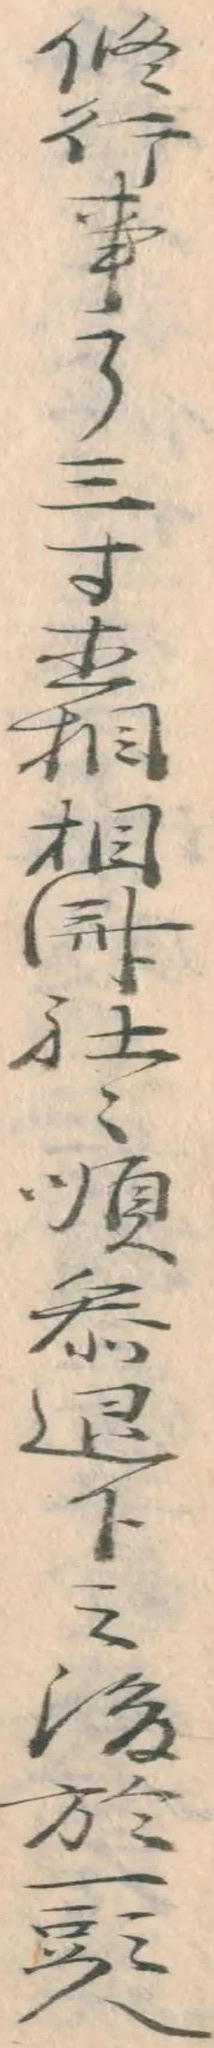修行事了三寸直相相済社々順参退下之後於一頭人
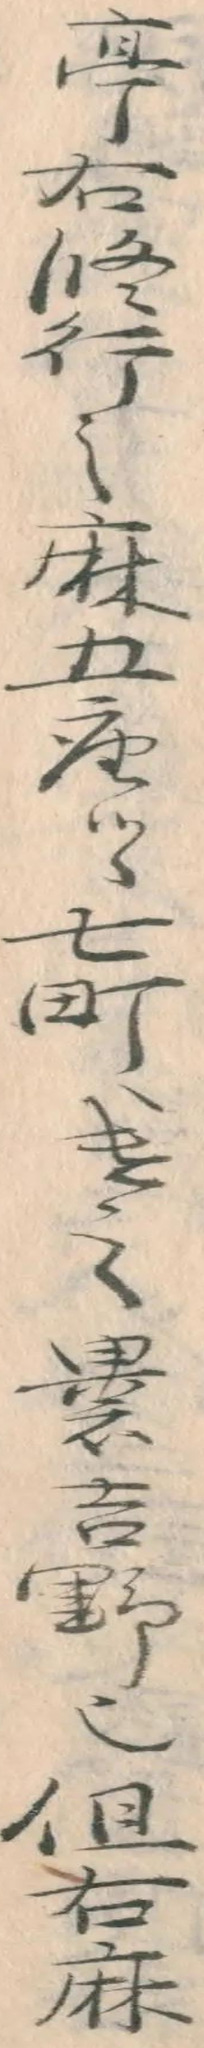亭右修行之麻五座ツヽ七町へ遣之褁吉野也但右麻
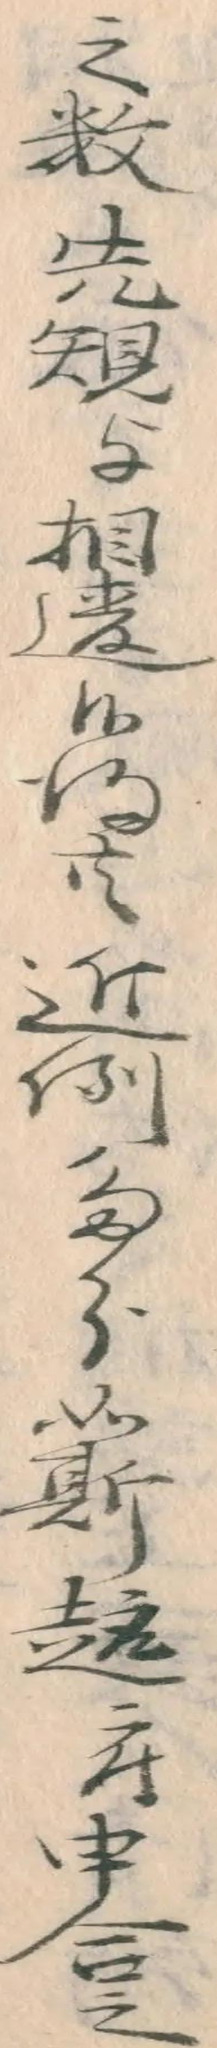之数先規と相違候得共近例多分如斯趣ニ付申合之
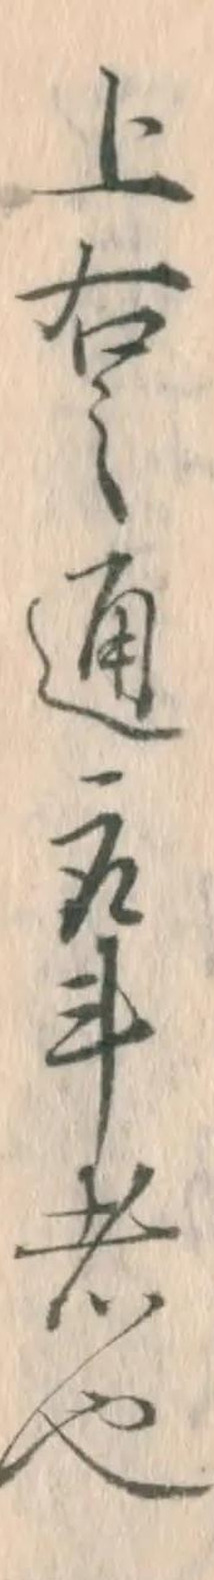上右之通取斗者也
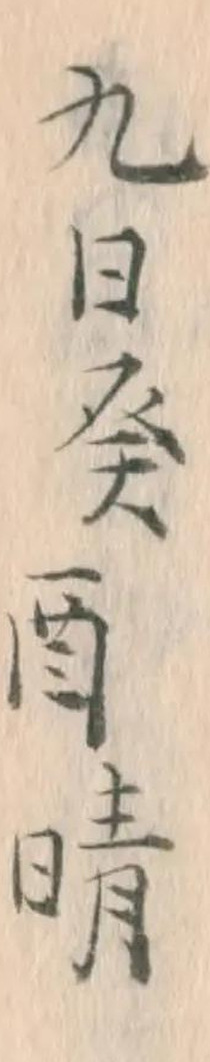九日癸酉晴
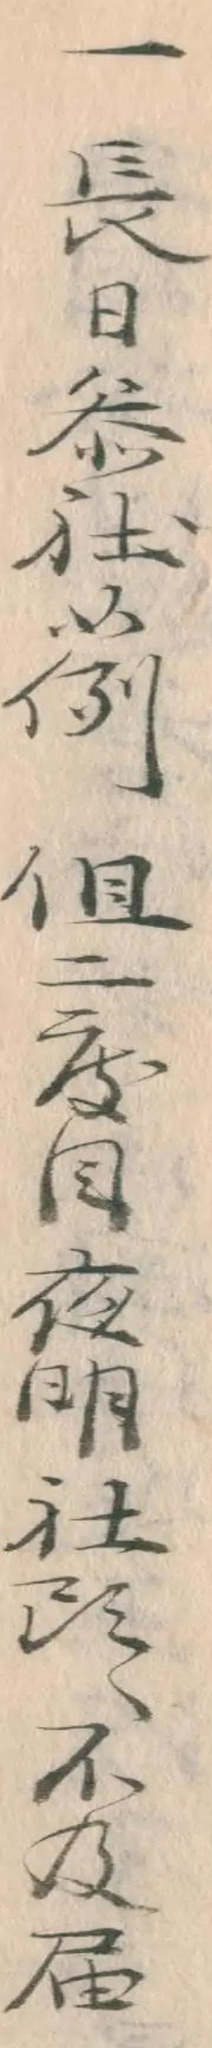一長日参社如例但二度目夜明社頭へ不及届
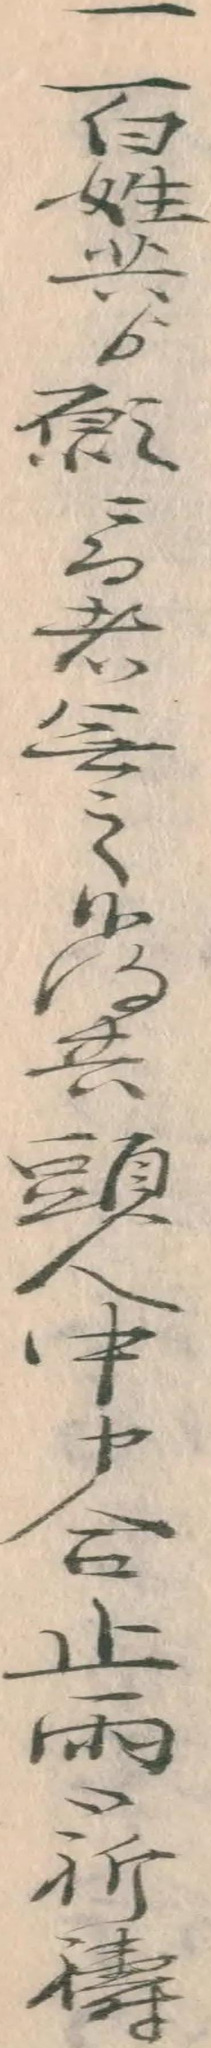一百姓共ゟ願ニ而者無之候得共頭人中申合止雨御祈祷
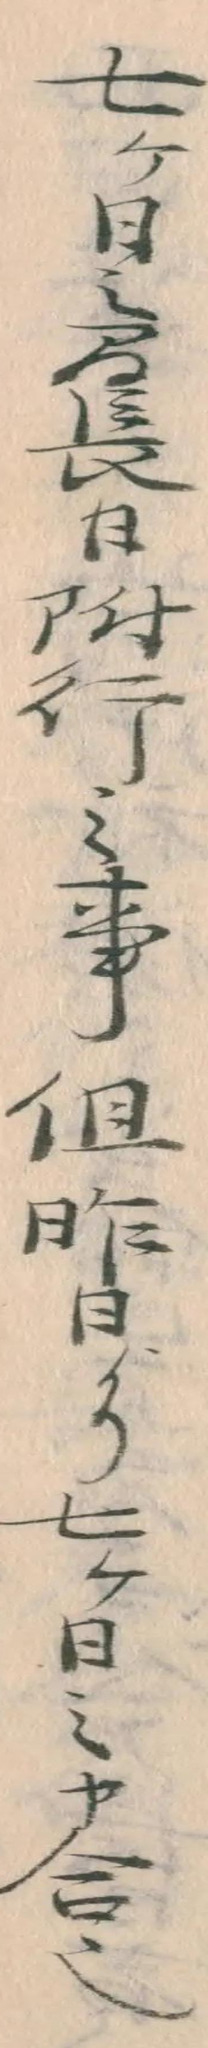七ヶ日之間長日附行之事但昨日より七ケ日之申合也
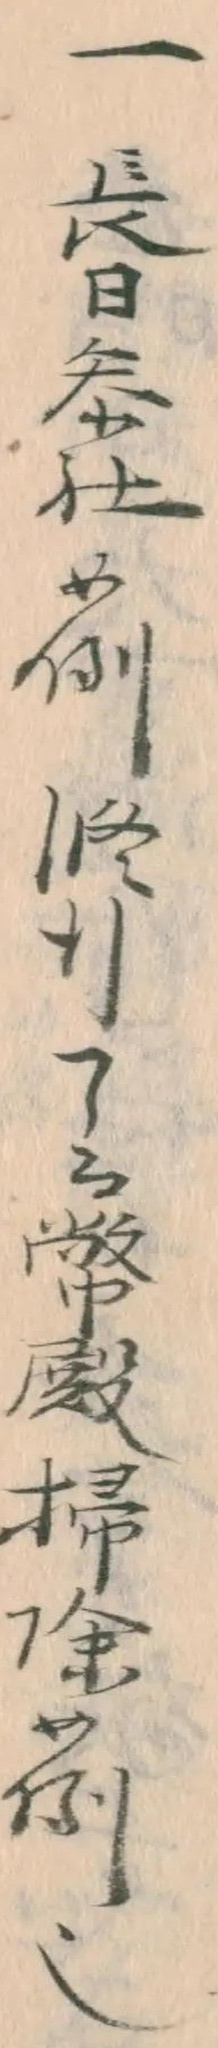一長日参社如例修行了而幣殿掃除如例也
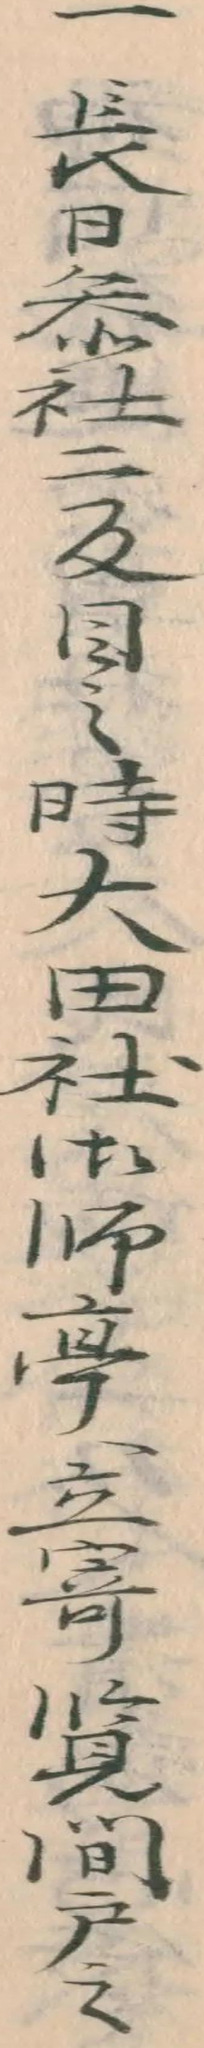一長日参社二反目之時大田社御師亭へ立寄覧間戸之
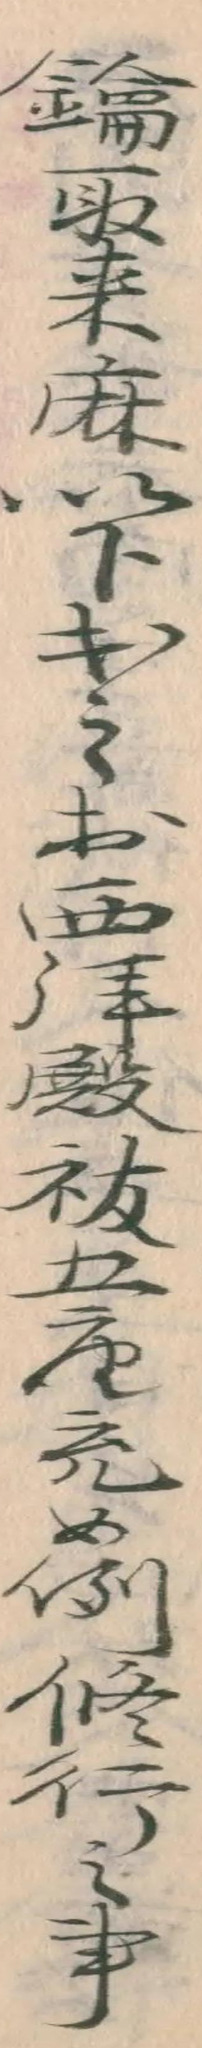鑰取来麻以下出之於西拝殿祓五座充如例修行之事
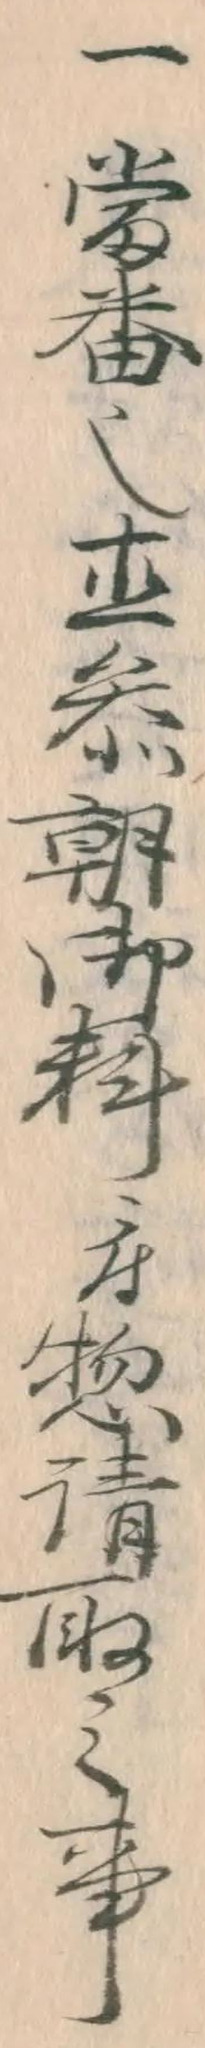一當番也直参朝御料ニ付惣請取之事
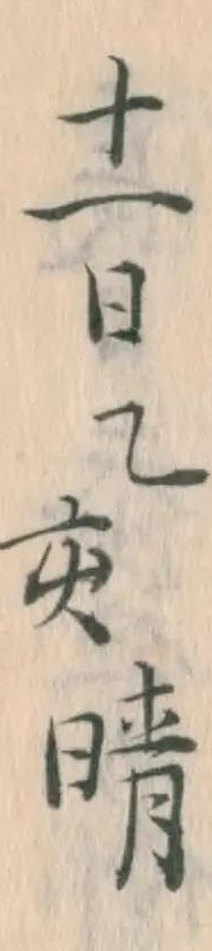十一日乙亥晴
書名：賀茂社記録. 第73冊
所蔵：国立国会図書館 National Diet Library, JAPAN
